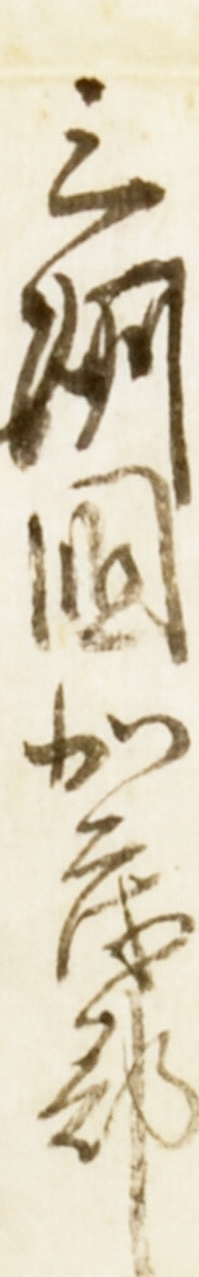三河国加茂郡
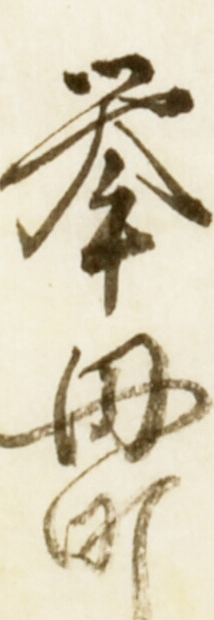挙母町

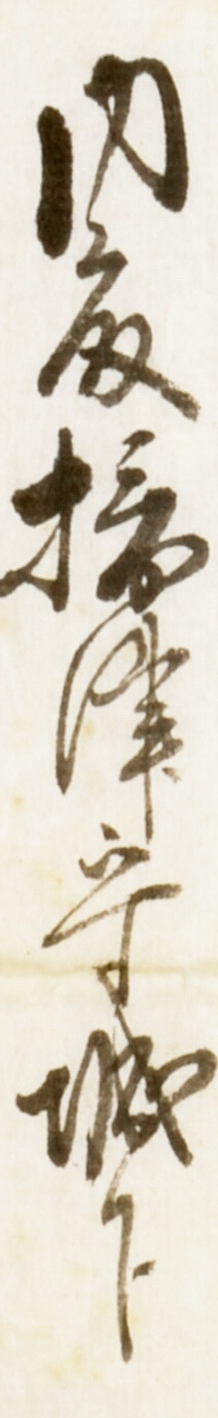内藤摂津守城下
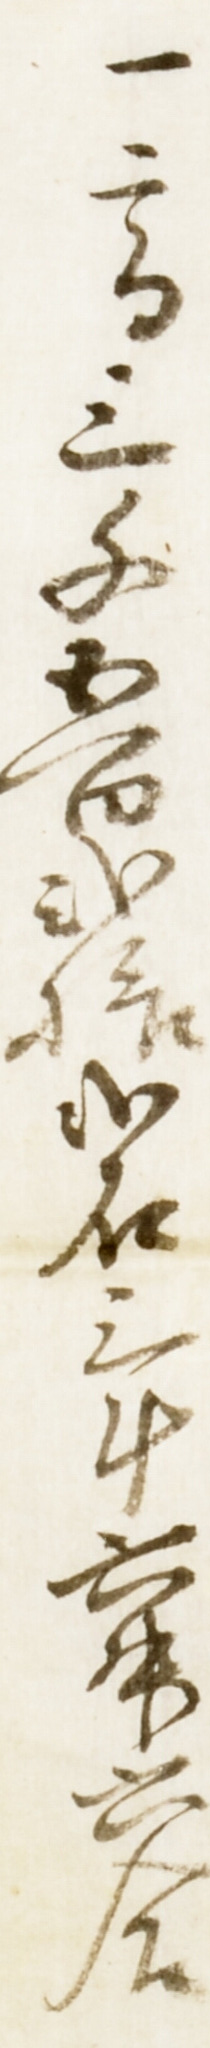一高三千五百弐拾弐石三斗六升六合
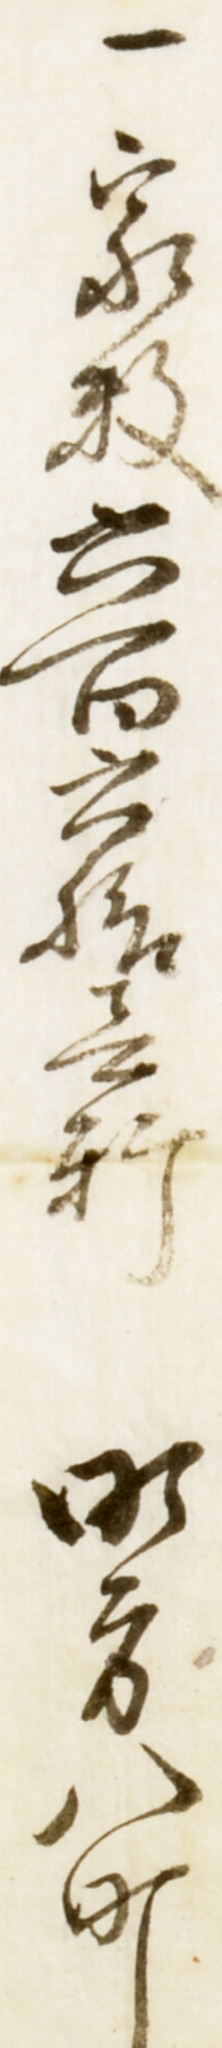一家数六百六拾壱軒町方八町

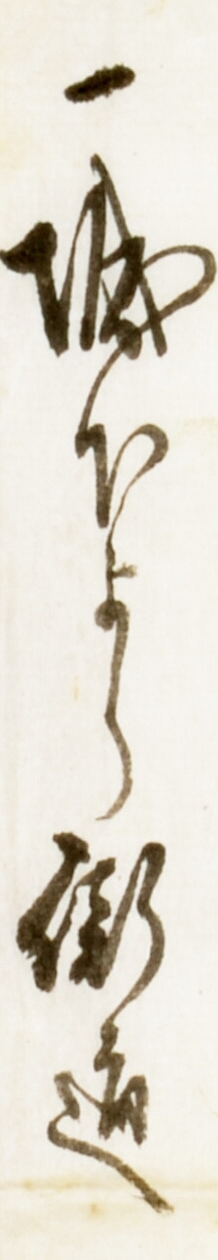一城下より街道
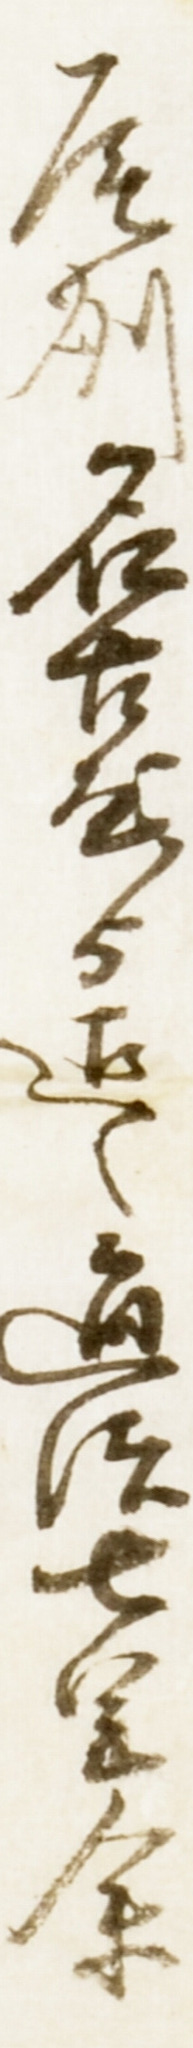尾州名古屋ゟ迄之道法七里余
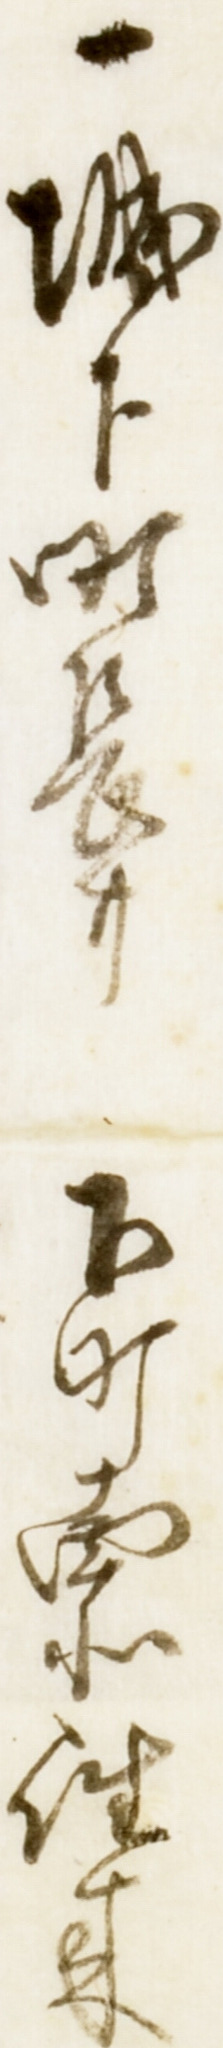一城下町長サ下町南北往来
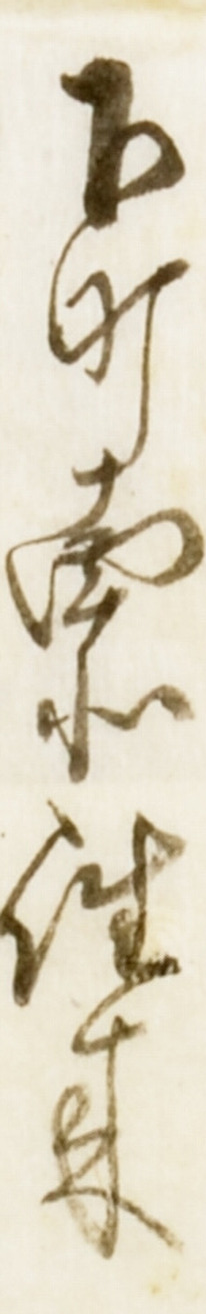樹木町南北往来
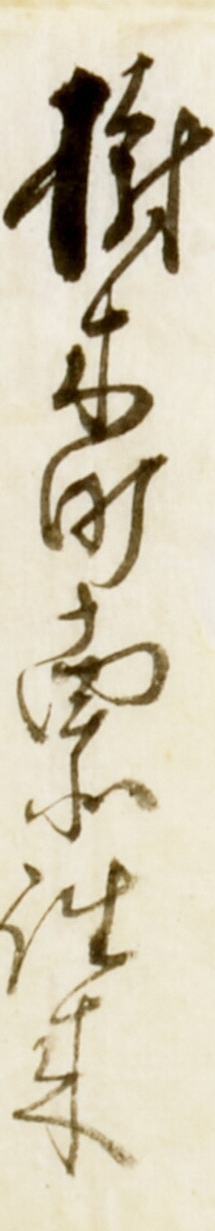樹木町南北往来
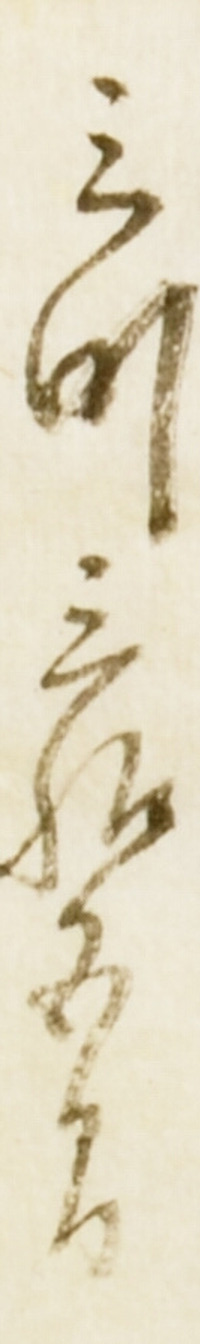三町三拾五間
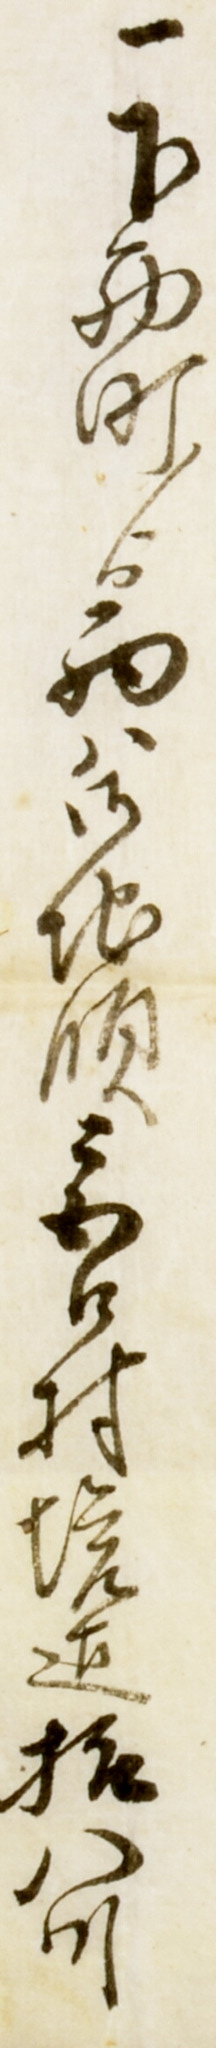一下西町ゟ西ハ御他領宮口村境迄拾八町
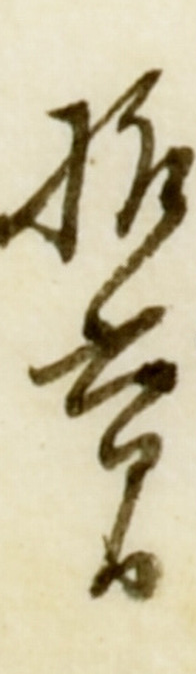拾六間
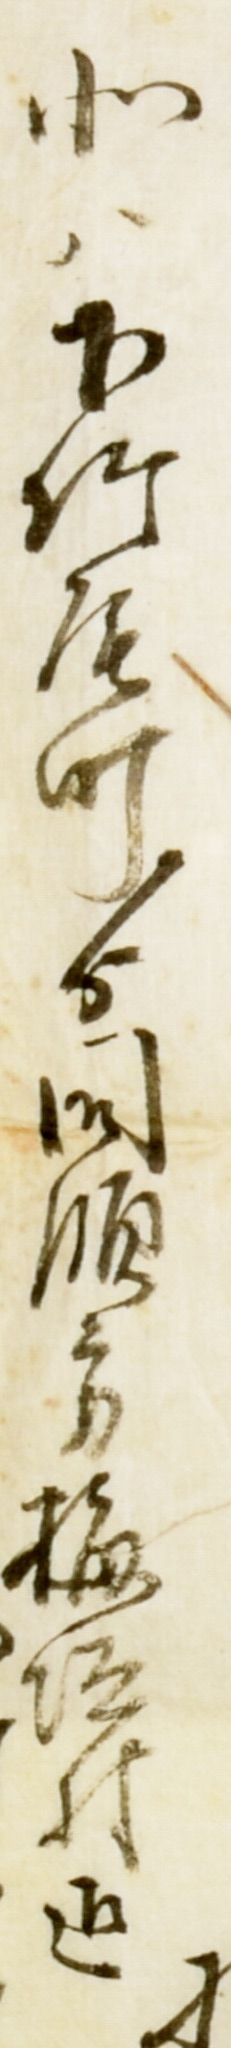北ハ下竹尾町ゟ同領分梅垣村迄
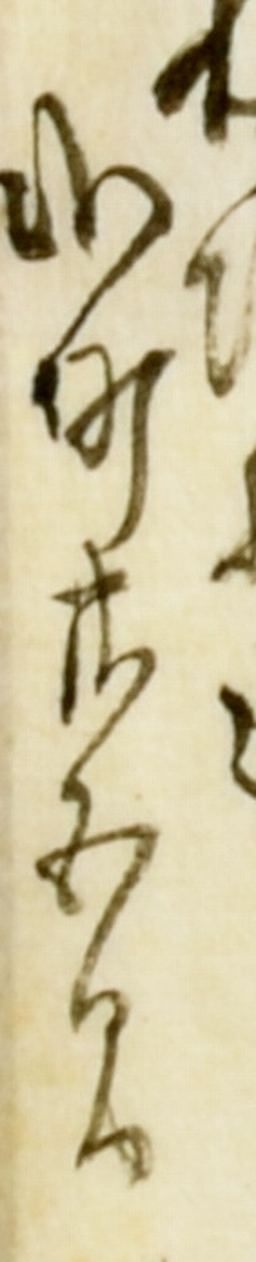弐町廿五間

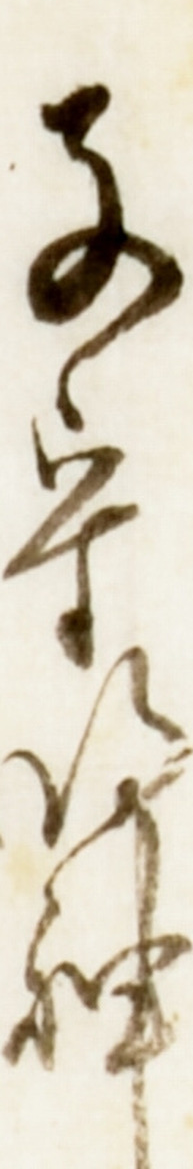子守明神
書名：書上（控）
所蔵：伊那市立高遠町図書館・合同会社AMANE
